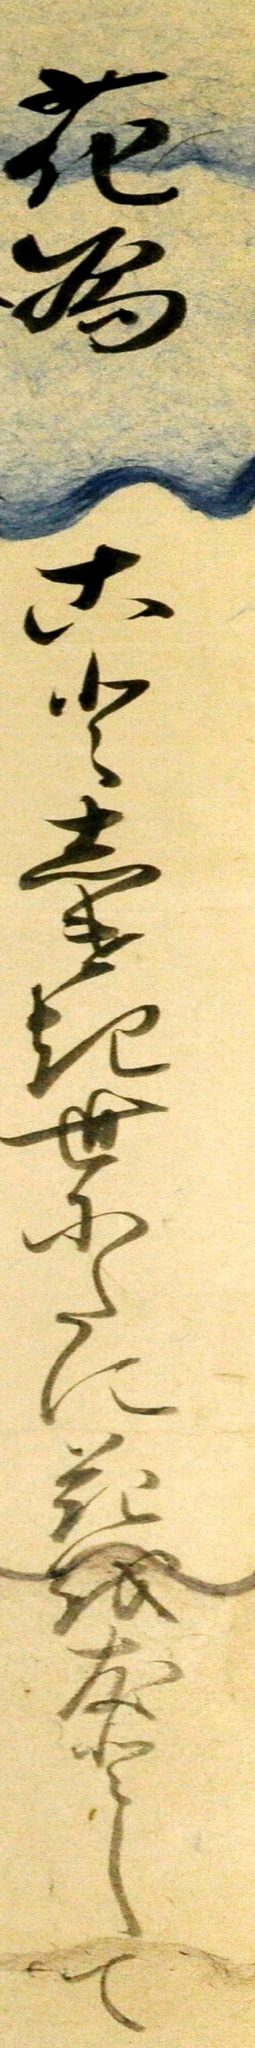ことしけき世にたに花を友として
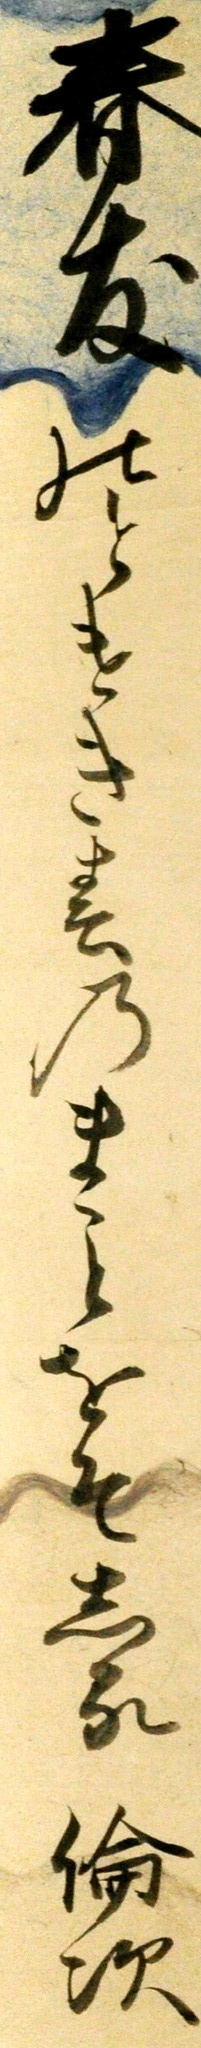のとけき春のまことをそしる倫次
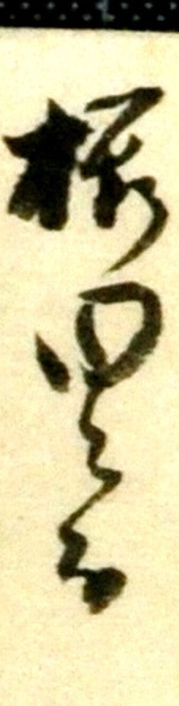桜田にて
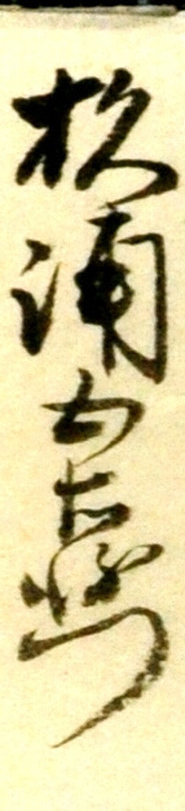杉浦五右衛門

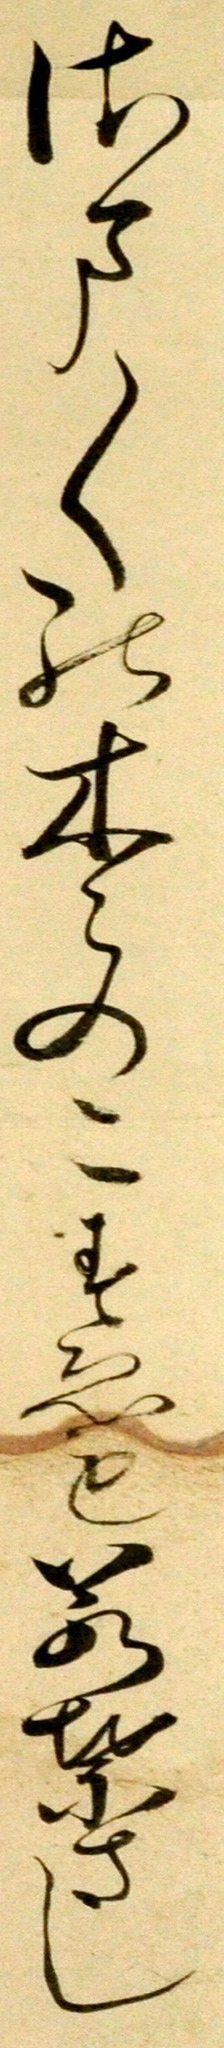さま〳〵の木々のこすゑも若葉さし
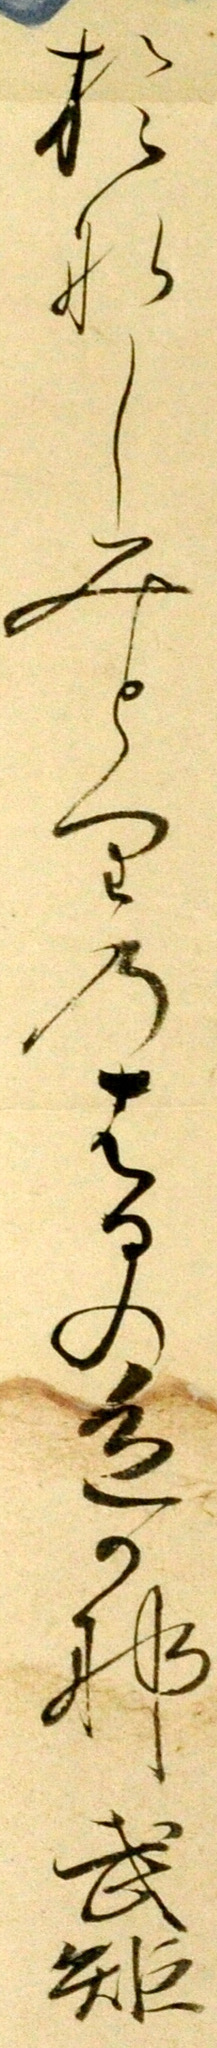おなしみとりのはるの色かな武矩
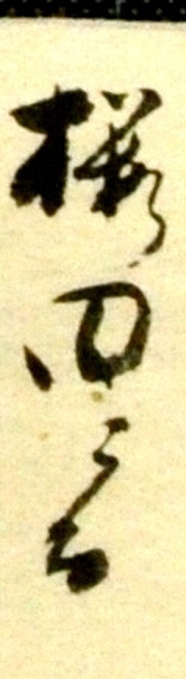桜田にて
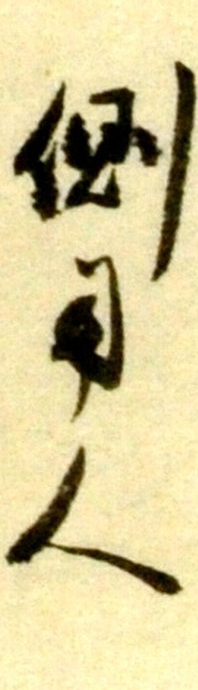側用人
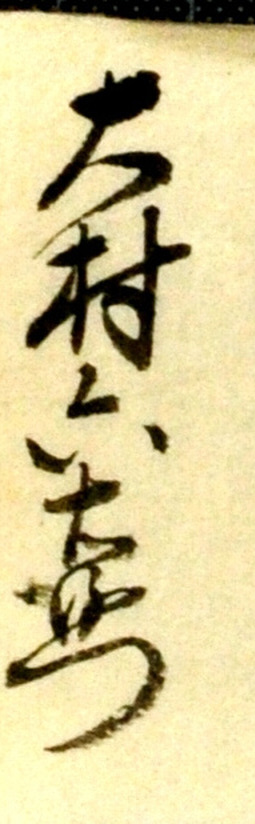大村六右衛門

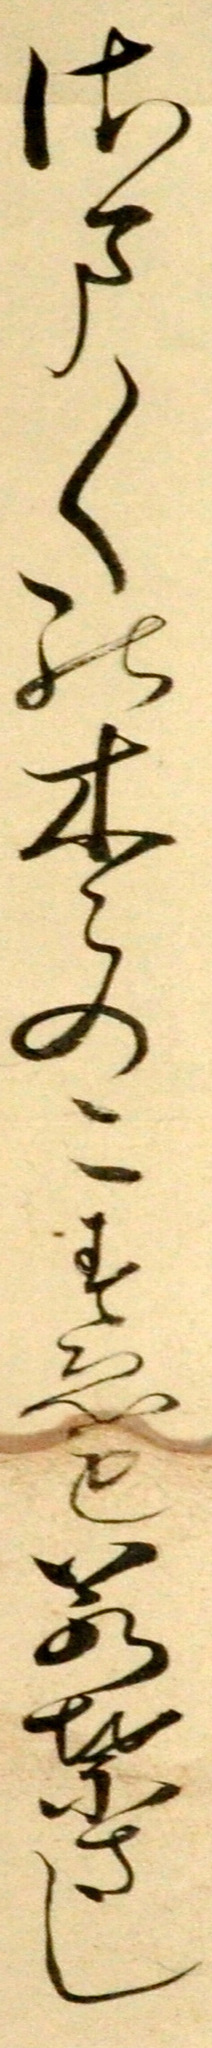さま〳〵の木々のこすゑも若葉さし
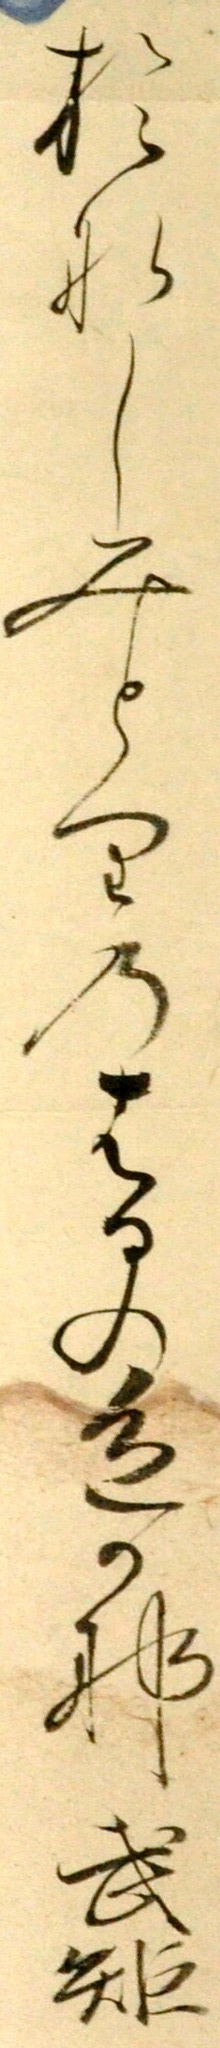おなしみとりのはるの色かな武矩

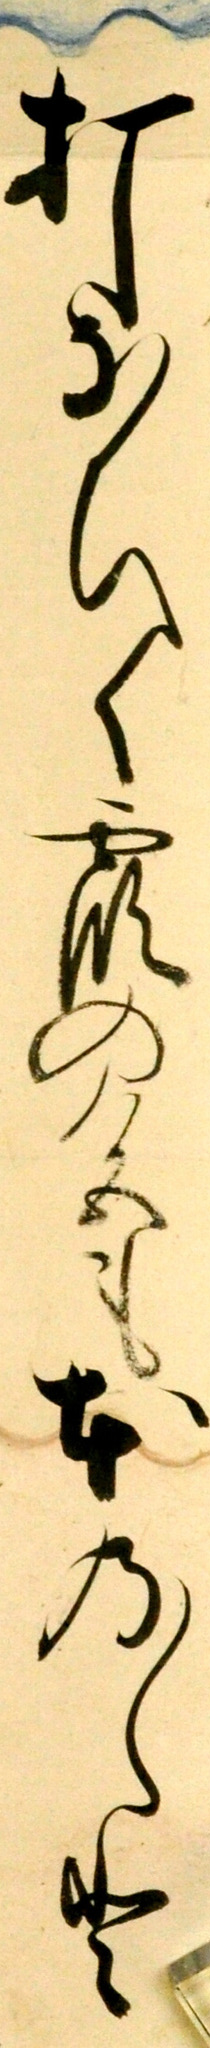打なひく霞の色もほの〳〵と
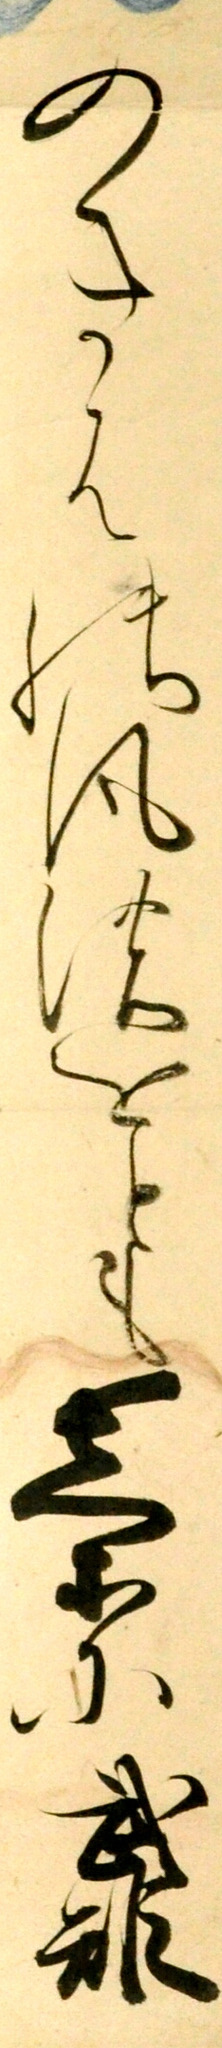のきはの風のをとも長閑に武矩

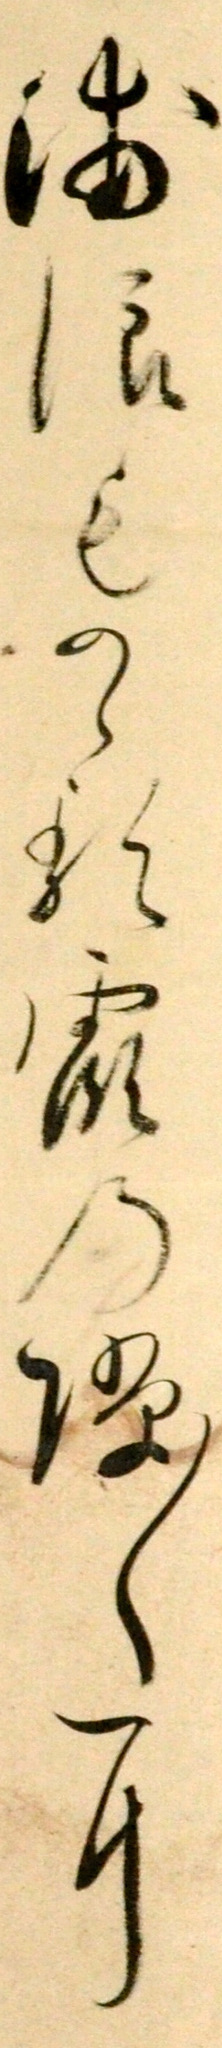浦浪もかゝる霞の隙〳〵に
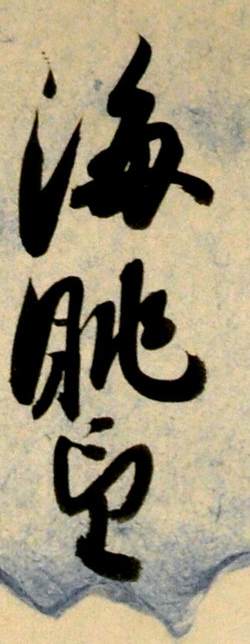海眺望
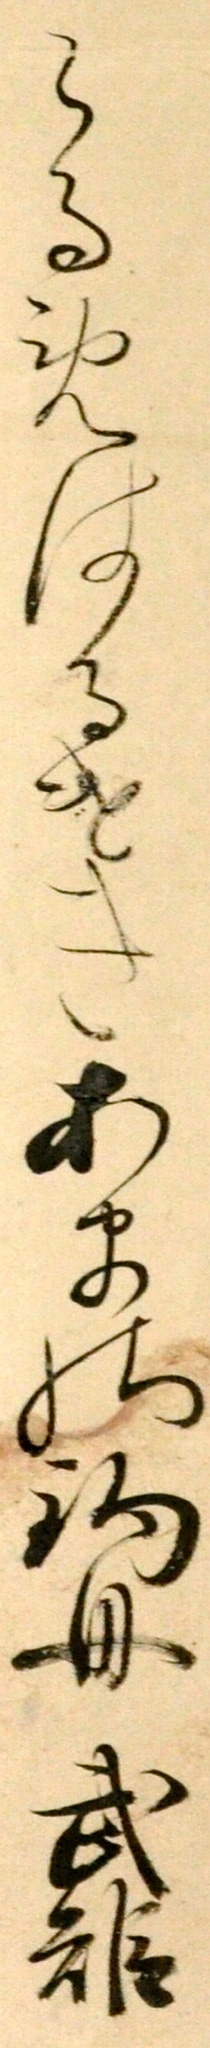みるめはるけきあまの釣舟武矩
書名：短冊
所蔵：伊那市立高遠町図書館・合同会社AMANE
